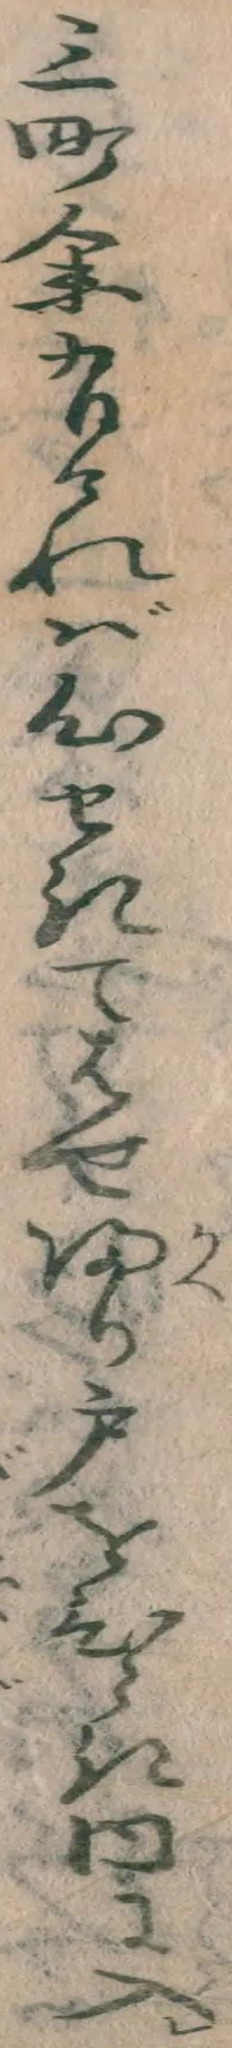三町余有ければ心せきてはせ帰り戸をひらき内に入
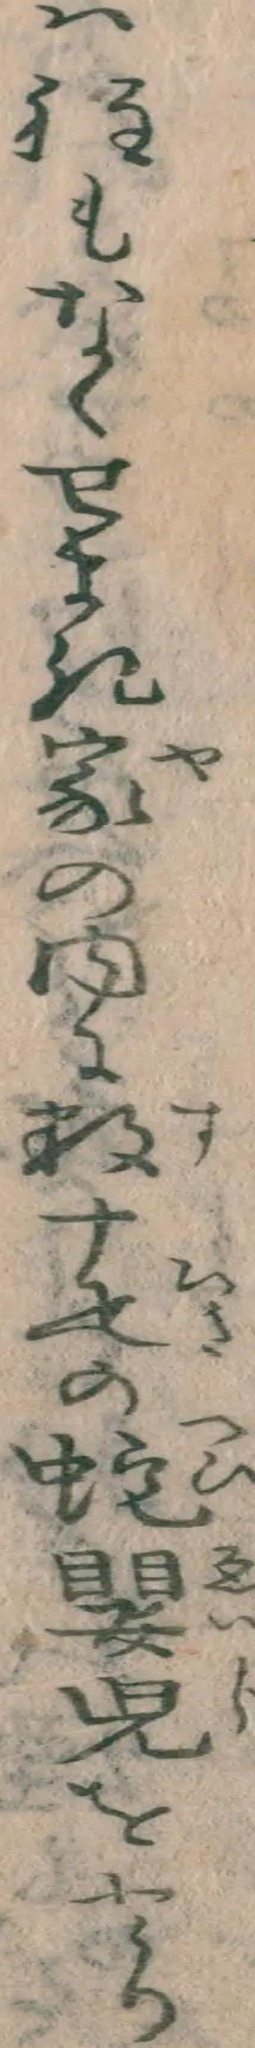は程もなくせまき家の内に数十匹の蛇嬰児をとり
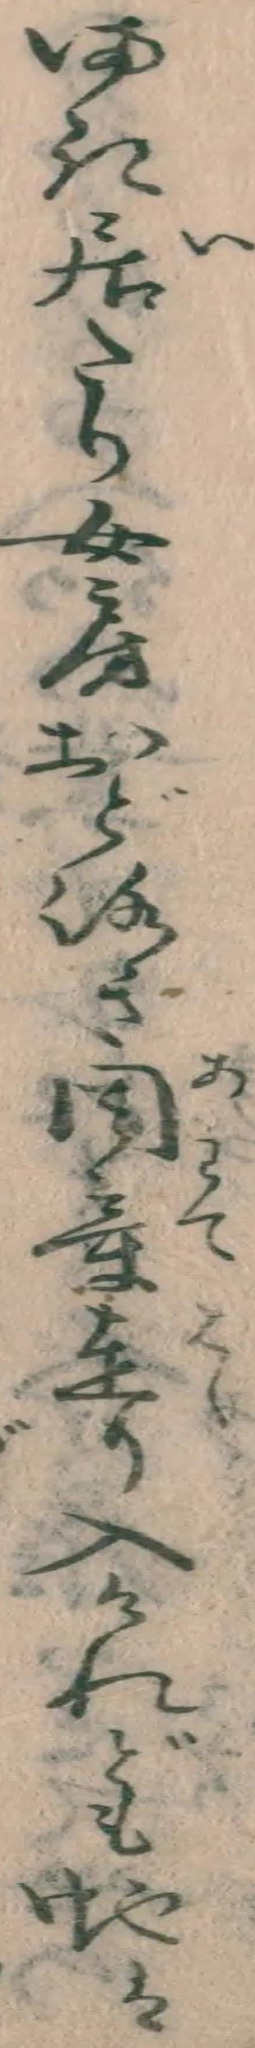まき居たり女房おどろき周章走り入けれども蛇は
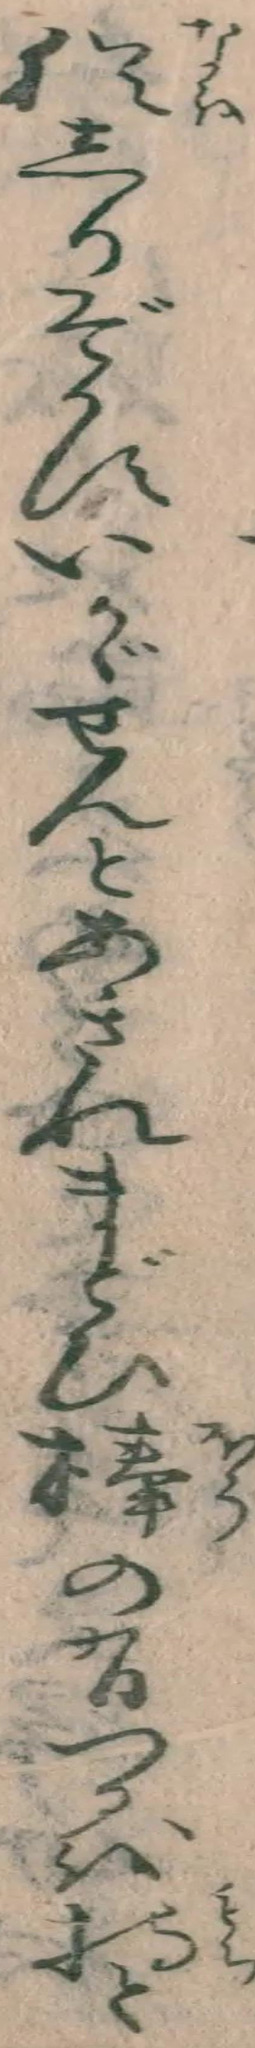猶しりぞかすいかゞせんとあきれまどひ棒の有つるを持て
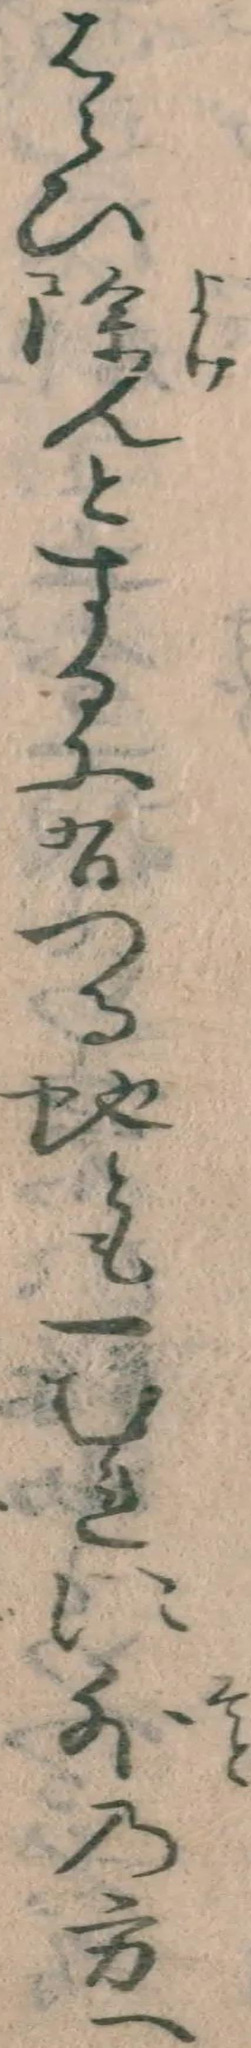はらひ除んとするに有つる蛇とも一むれに外の方へ
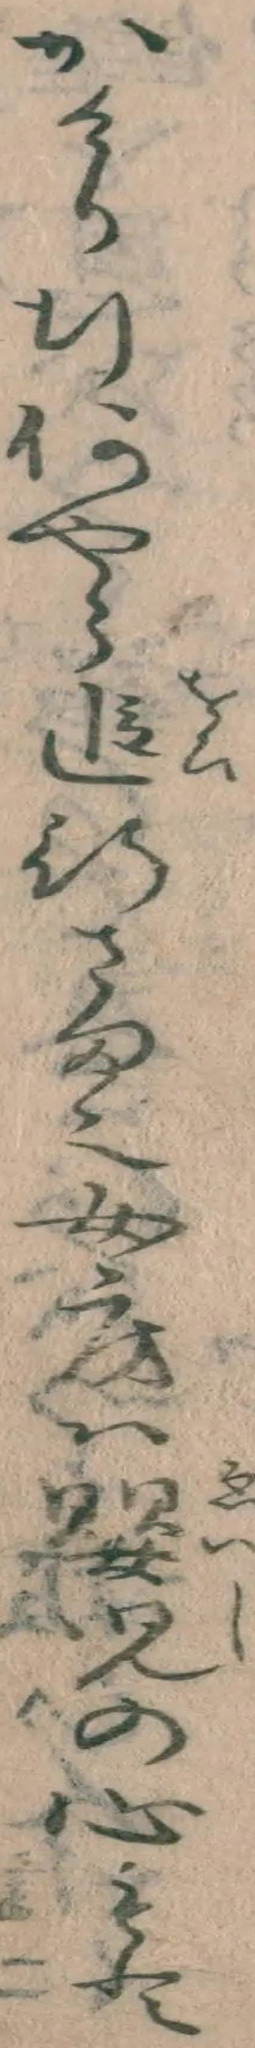かけり行何やら追行さま也女房は嬰児の心もと
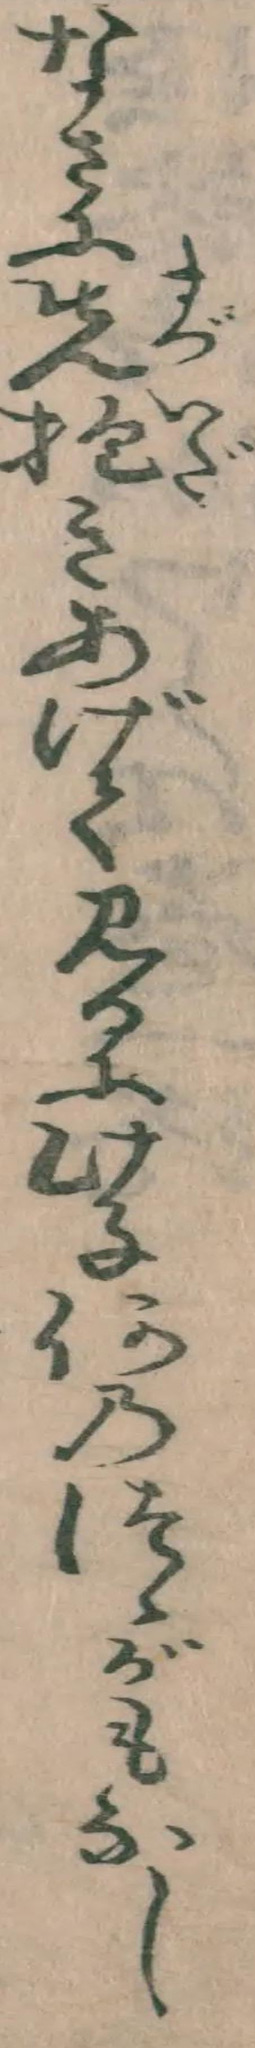なさに先抱きあげて見るに此子何のつゝがもなし
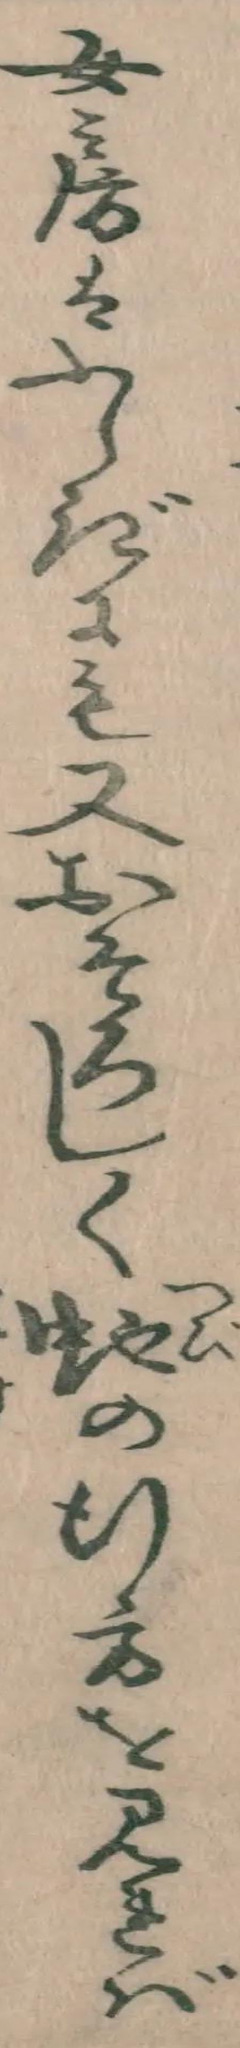女房はふしぎにも又おそろしく蛇の行方を見れば
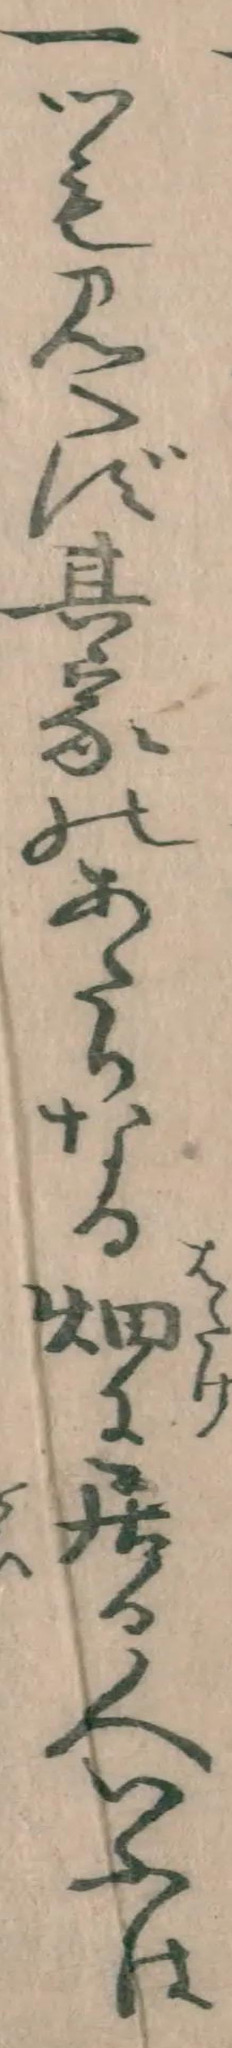一つも見へず其家のあたりなる畑に居る人いふは
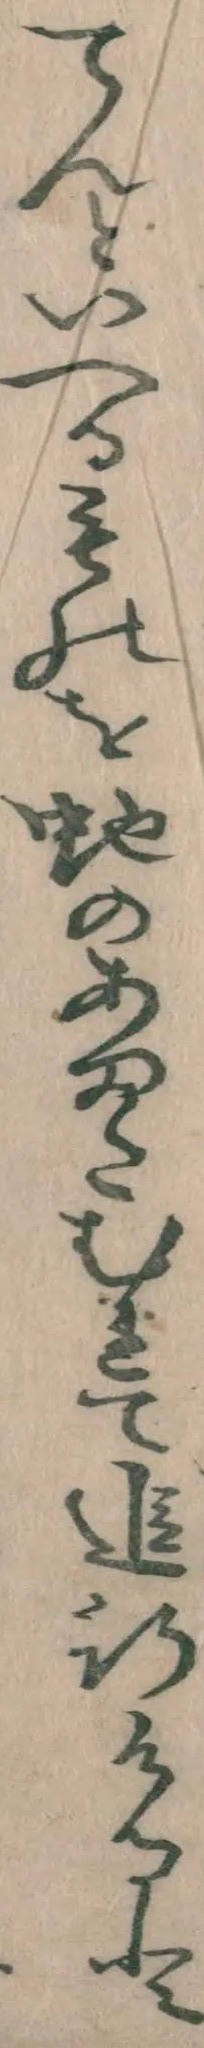てんといへるものを蛇のあまたむれて追行けると
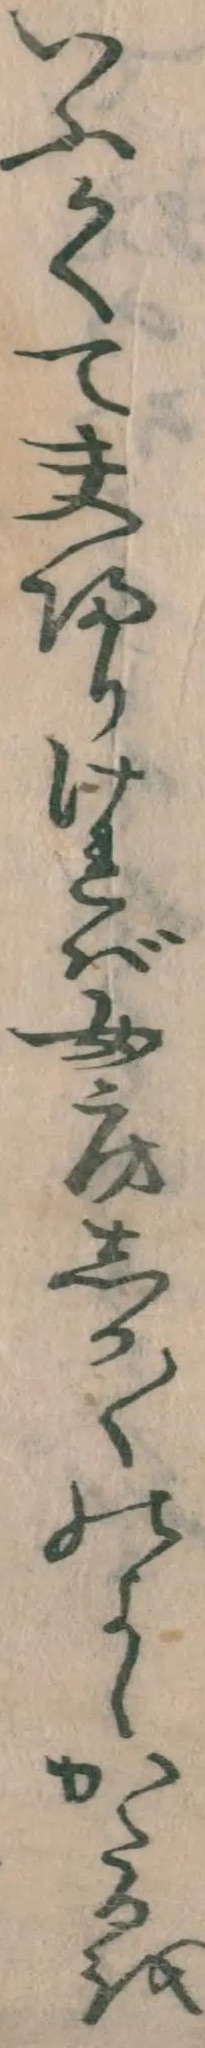いふかくて夫帰りければ女房しか〳〵のよしかたるを
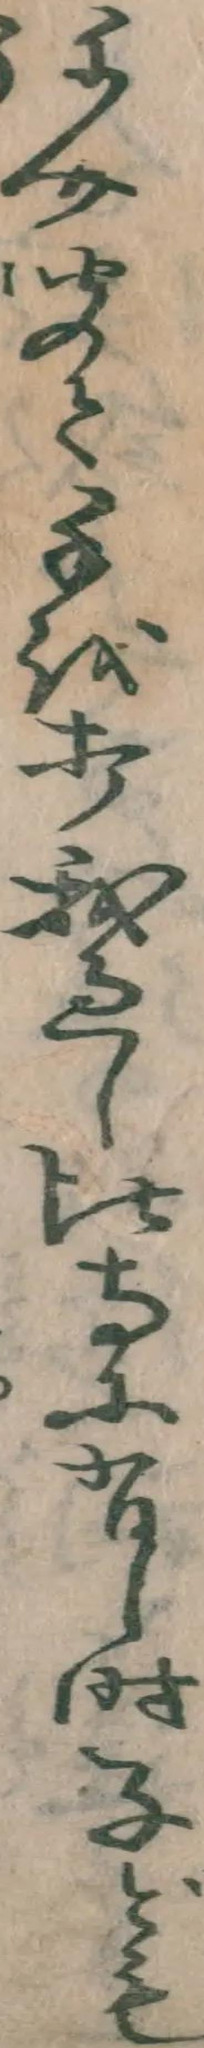弥介聞て手を打我過し頃寺に有し時子ども
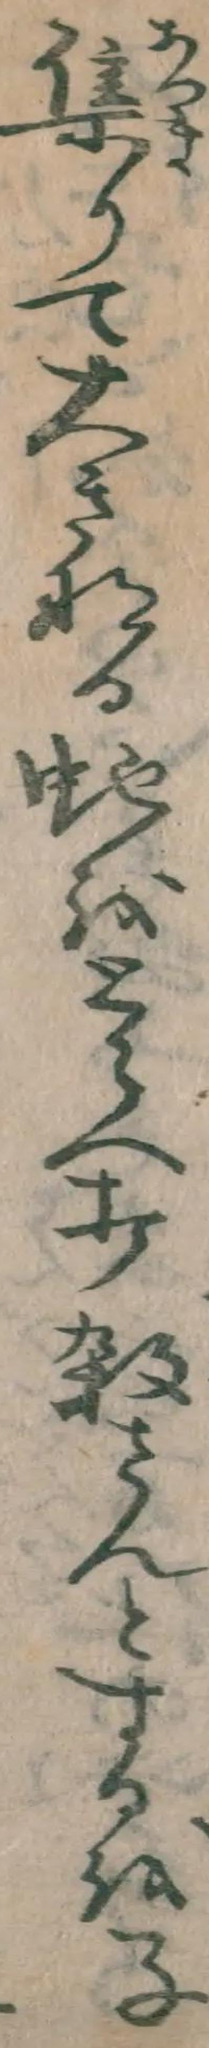集りて大きなる蛇をとらへ打殺さんとするを子
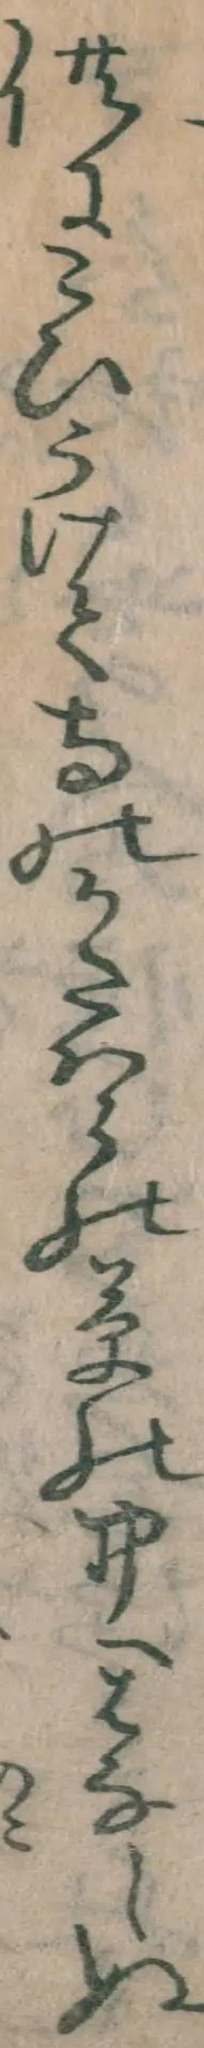供にこひうけて寺のかたはらの草の中へはなしぬ
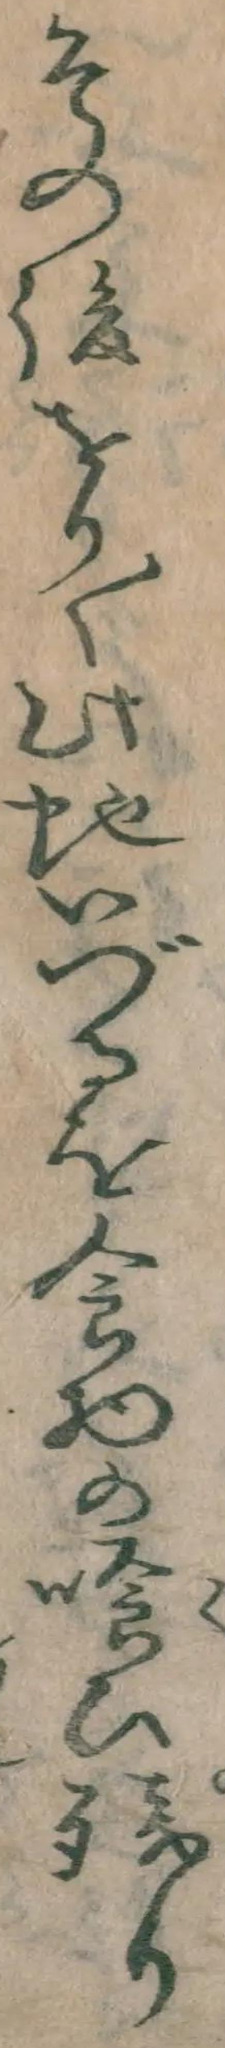その後をり〳〵此地いづるを食物の喰ひ残り
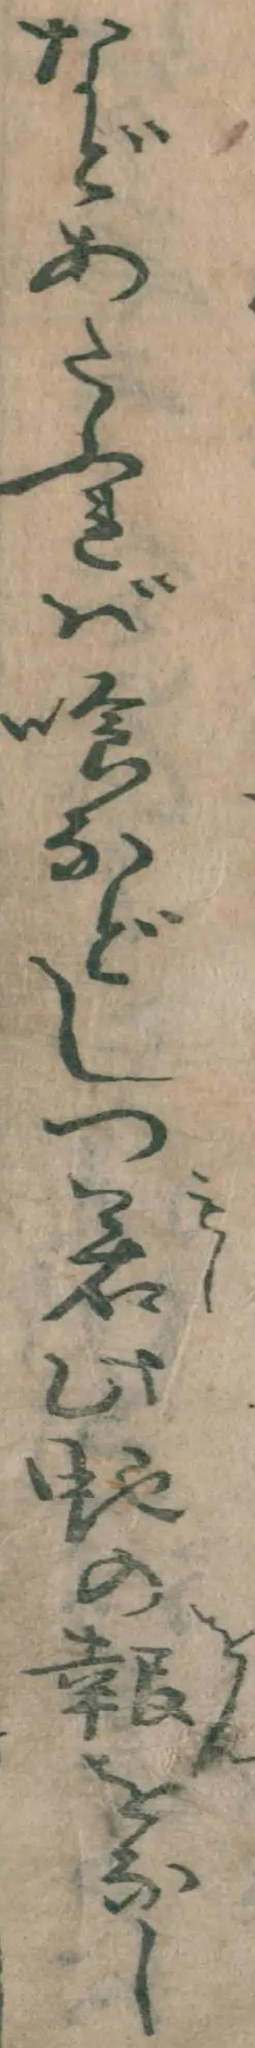などあたふれば喰などしつ若此蛇の報をなし
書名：怪談御伽童 5巻. [1]
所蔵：国立国会図書館 National Diet Library, JAPAN
